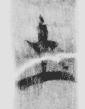十一
